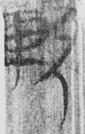○（范）
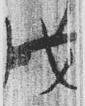戊
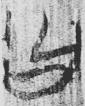曰
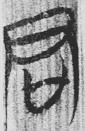君
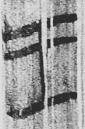王
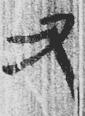又（有）
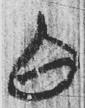白
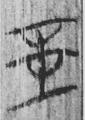玉
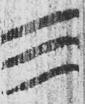三
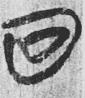回
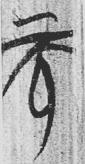而
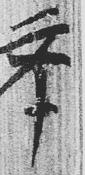不
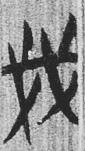戔
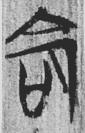命
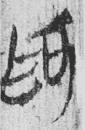爲
